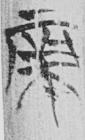帝
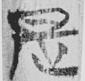是
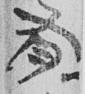有（祐）
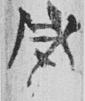凡
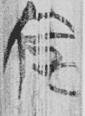○（托）
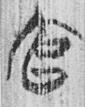官
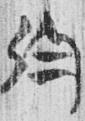於
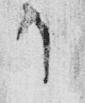人
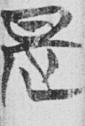是
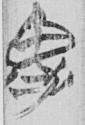{胃刀}（謂）
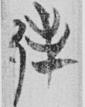邦
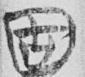固
